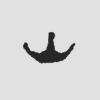山
